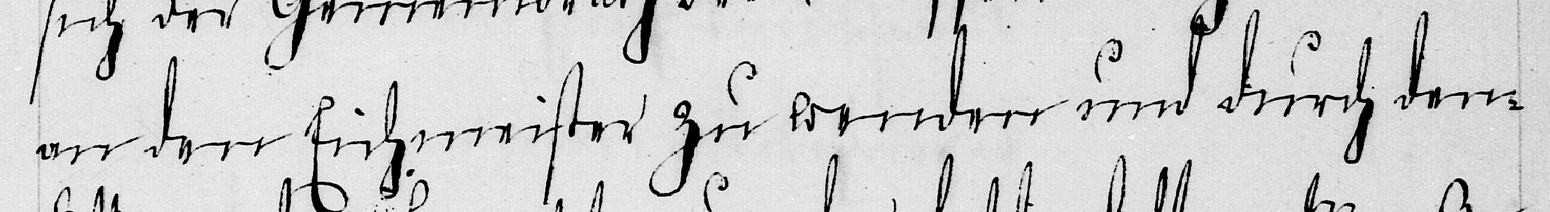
an den Eichmeister zu wenden und durch den¬
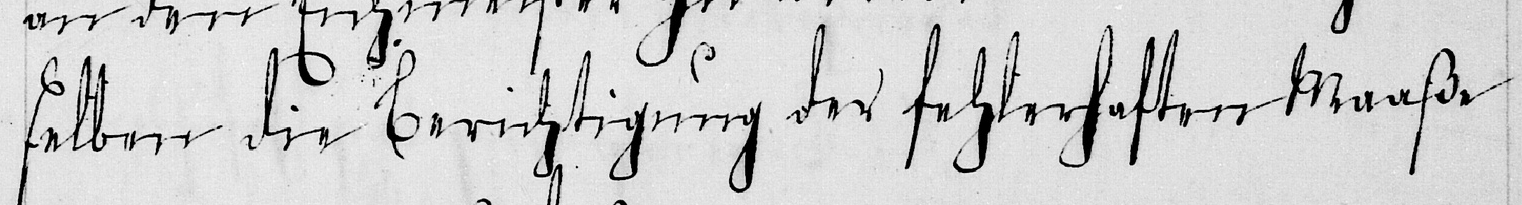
selben die Berichtigung der fehlerhaften Maaße
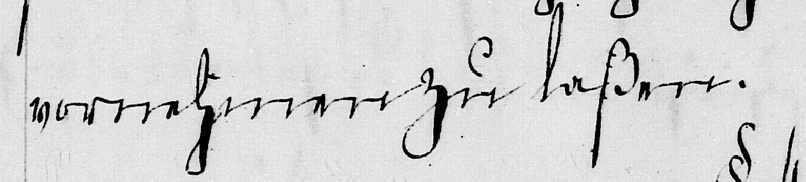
vornehmen zu laßen.
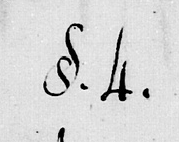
§. 4.
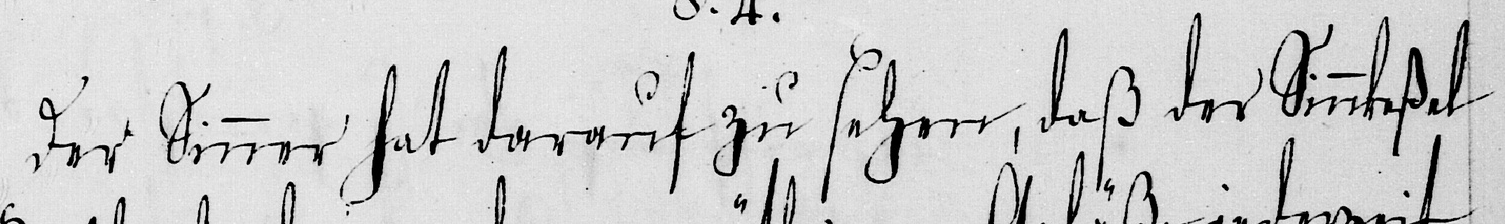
Der Sinner hat darauf zu sehen, daß der Sinnke¬
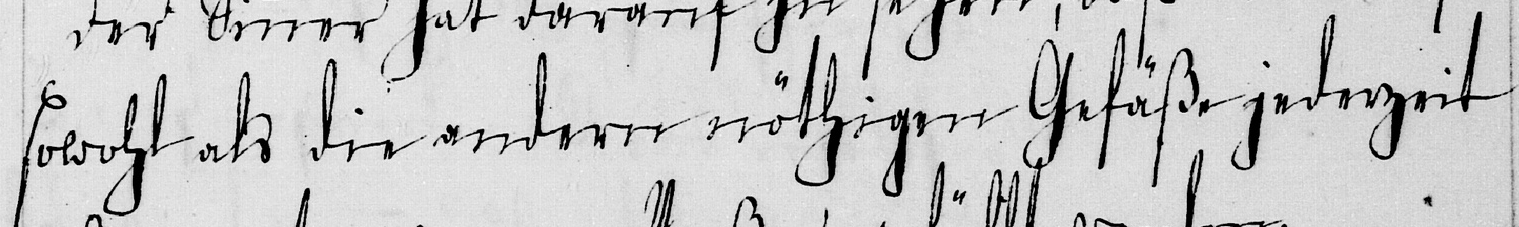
sowohl als die andern nöthigen Gefäße jederzeit
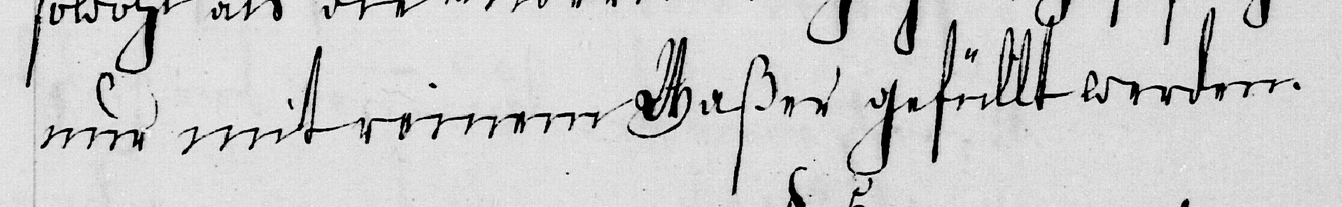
nur mit reinem Waßer gefüllt werden.
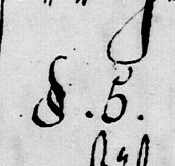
§. 5.
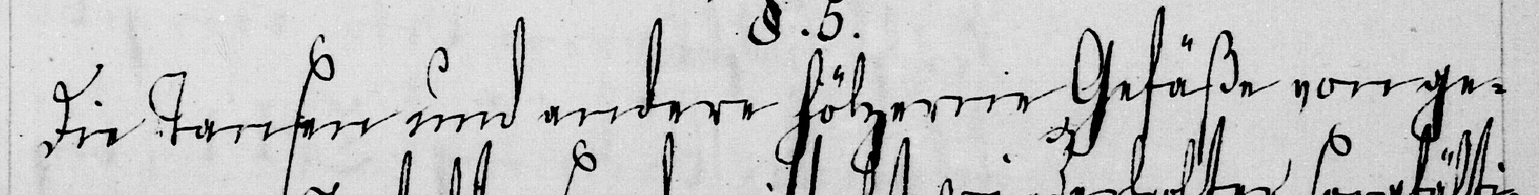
Die Tansen und andere hölzerne Gefäße von ge¬
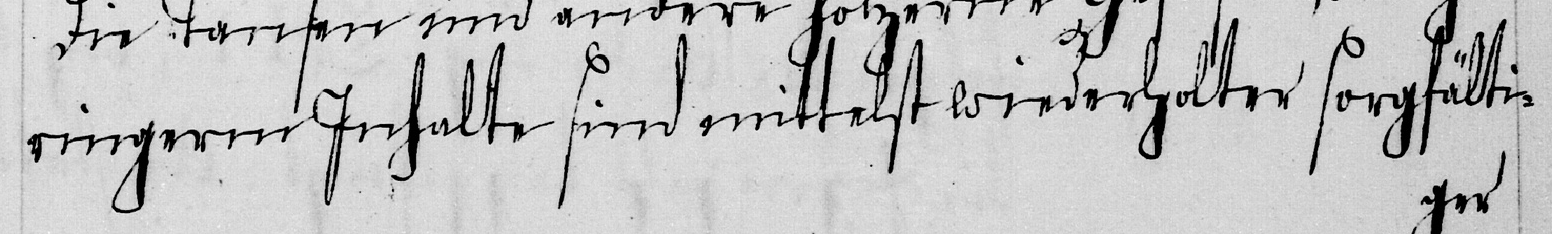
ringerm Inhalte sind mittelst wiederholter sorgfälti
